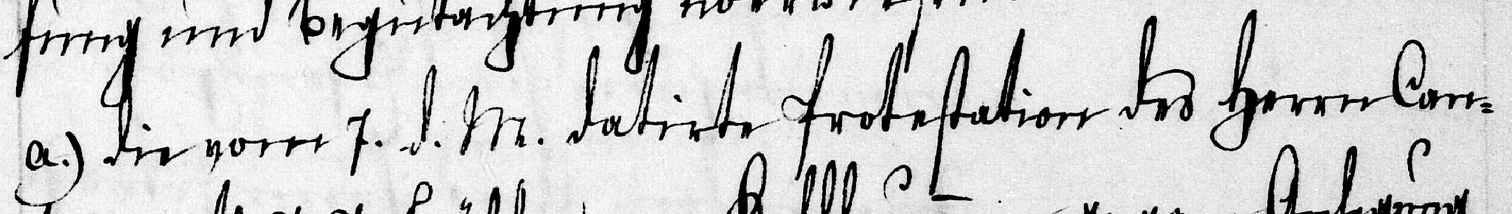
a.) die vom 7. d. M. datirte Protestation des Herrn Can¬
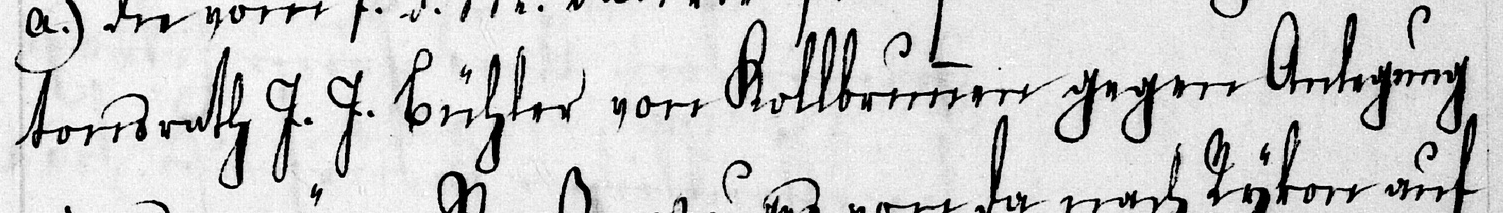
tonsrath J. J. Bühler von Kollbrunnen gegen Anlegung
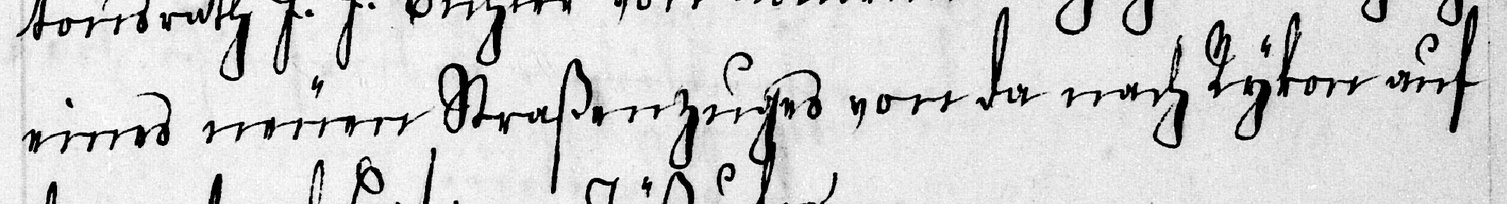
eines neuen Straßenzuges von da nach Rykon auf
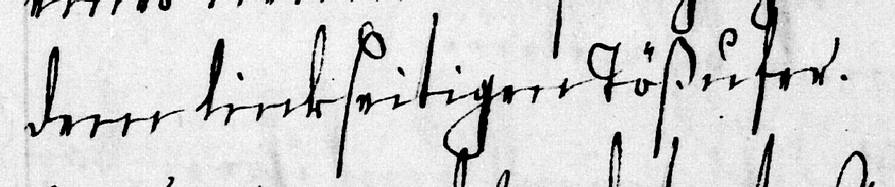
dem linkseitigen Tößufer.
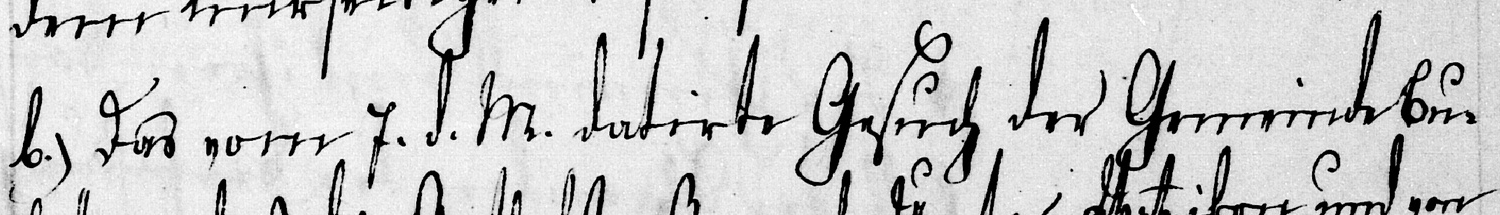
b.) Das vom 7. d. M. datirte Gesuch der Gemeinde Bu¬
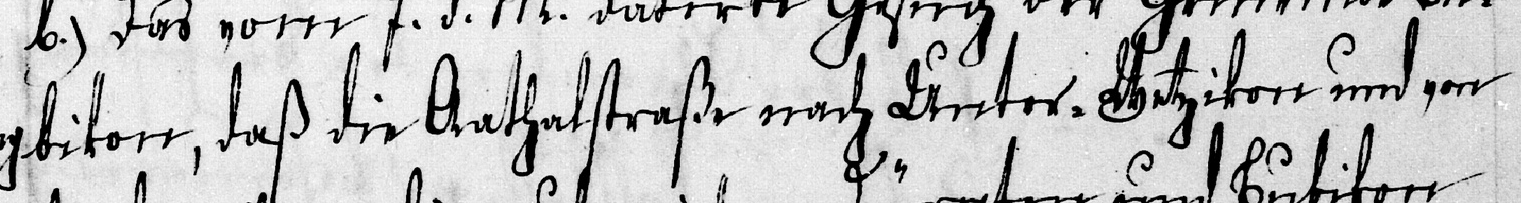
bikon, daß die Aathalstraße nach Unter-Wetzikon und von
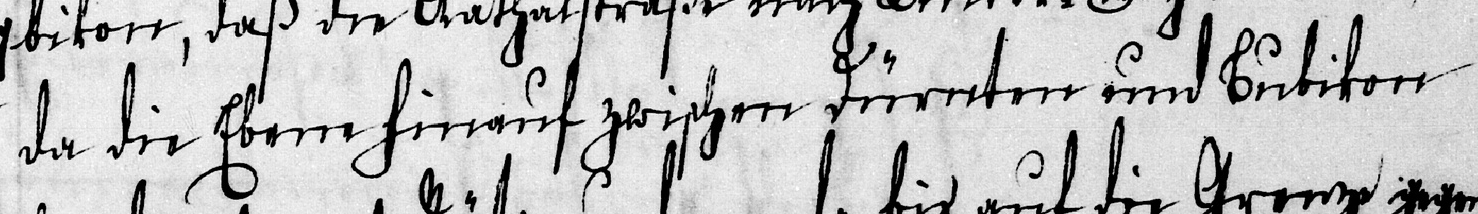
da die Ebene hinauf zwischen Dürnten und Bubikon
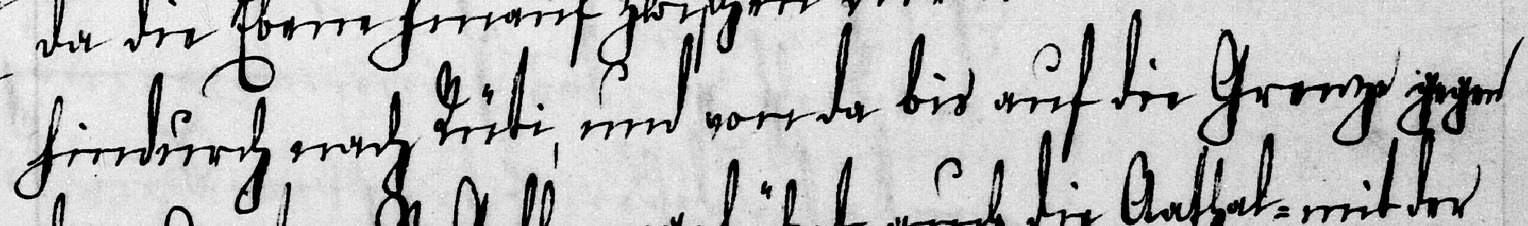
hindurch nach Rüti, und von da bis auf die Grenze gegen
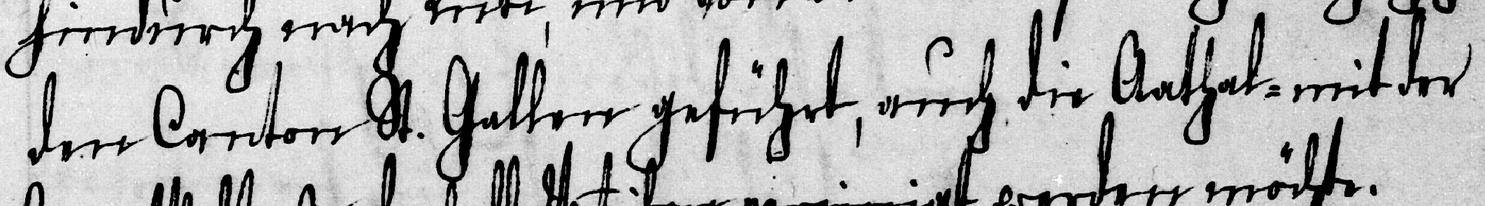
den Canton St. Gallen geführt, auch die Aathal- mit der
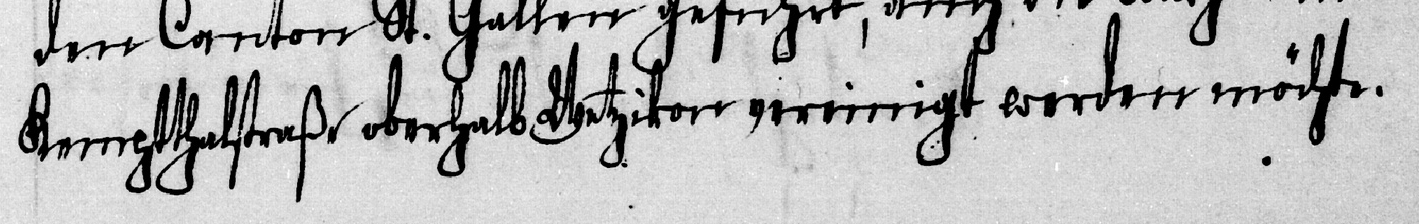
Kemptthalstraße oberhalb Wetzikon vereinigt werden möchte.
